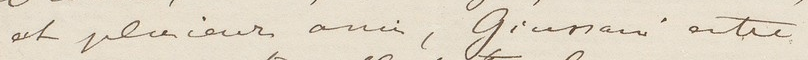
et plusieurs amis, Giussani entre
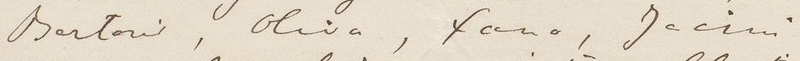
Bertoni, Oliva, Fano, Jacini,
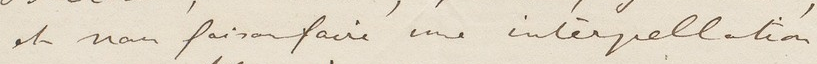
et nous faisons faire une intèrpellation
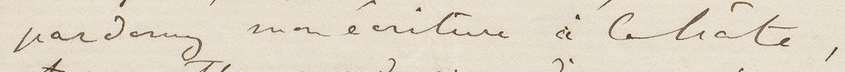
pardonnez mon écriture à la hâte,
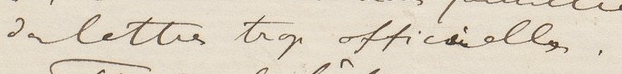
des lettres trop officielles.
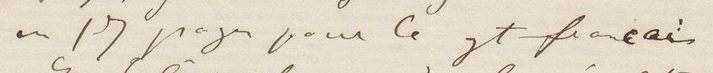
en 17 pages pour le gtfrançais.
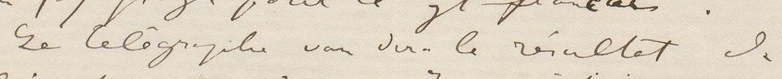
Le telêgraphe vous dira le résultat de
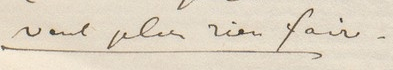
veut plus rien faire.
